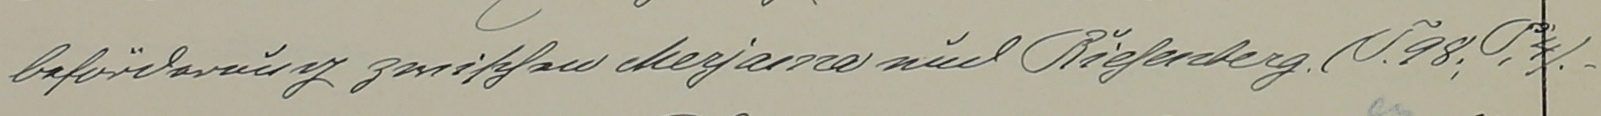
beförderung zwischen Merjama und Riesenberg. (T.98; P.4).
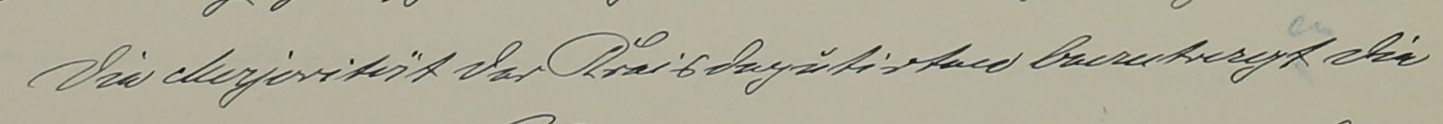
Die Majorität der Kreisdeputirten beantragt die
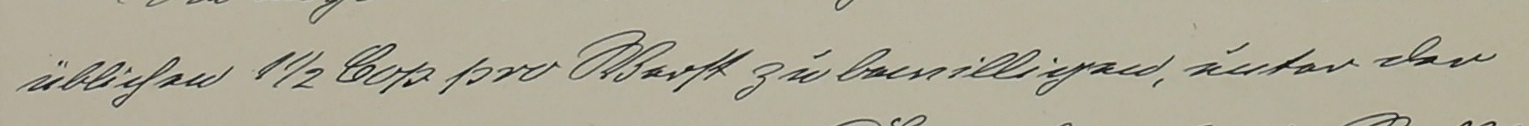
üblichen 1½ Cop. pro Werst zu bewilligen, unter der
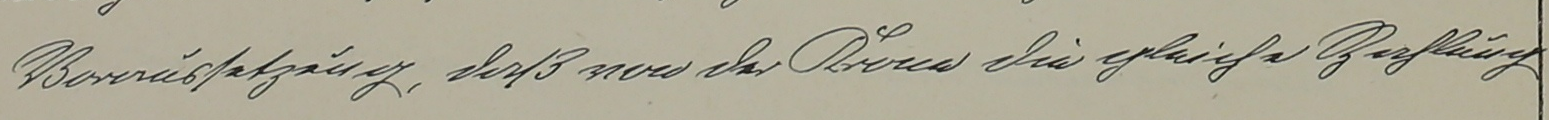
Voraussetzung, daß von der Krone die gleiche Zahlung
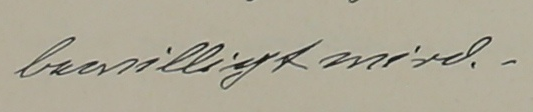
bewilligt wird.
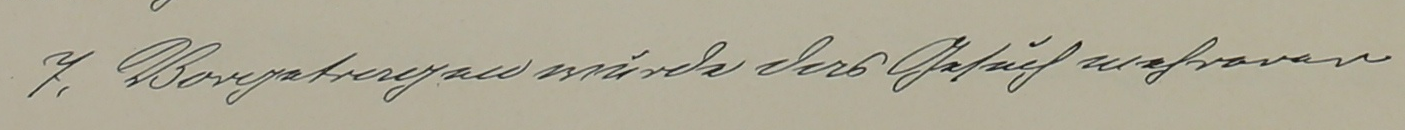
7. Vorgetragen wurde das Gesuch mehrerer
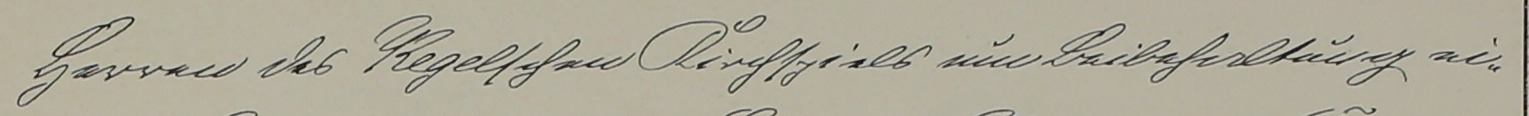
Herren des Kegelschen Kirchspiels um Beibehaltung ei-
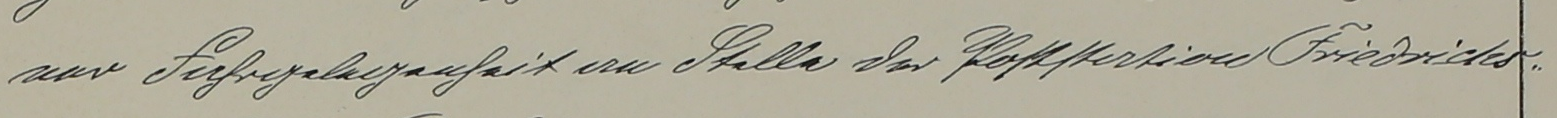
ner Fahrgelegenheit an Stelle der Poststation Friedrichs-
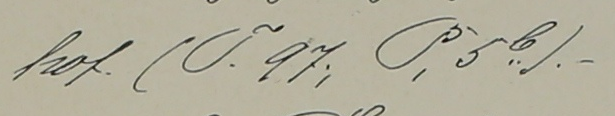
hof. (T.97; P.5b).
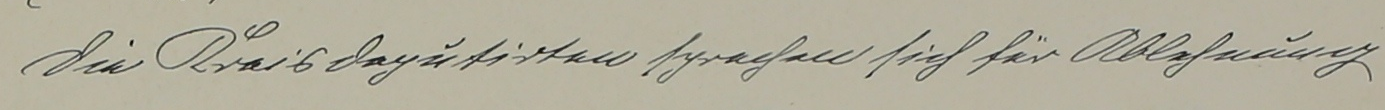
Die Kreisdeputirten sprachen sich für Ablehnung
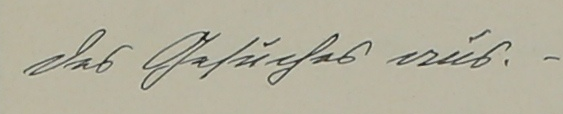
des Gesuches aus.
